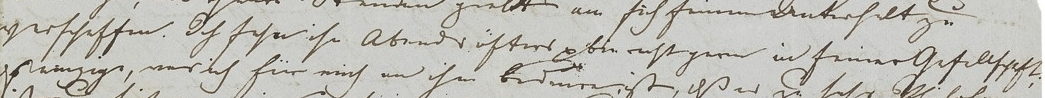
verschaffen. Ich sehe ihn Abends öfters & bin recht gerne in seiner Gesellschaft;
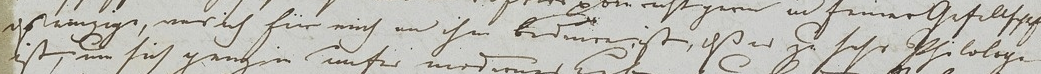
ds einzige, was ich für mich an ihm bedaure, ist, dß er zu sehr Philologe
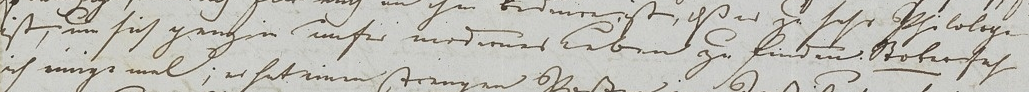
ist, um sich ganz in unser modernes Leben zu finden. Stoker sah
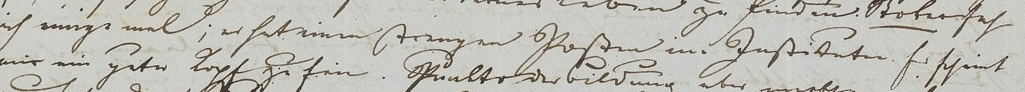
ich einige mal; er hat einen strengen Posten im Institute. Er scheint
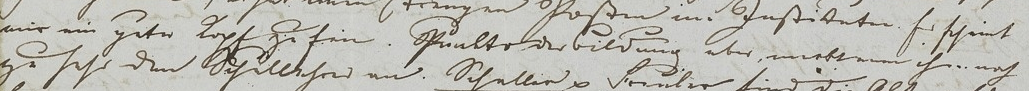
mir ein guter Kopf zu sein. Punkto der Bildung aber, merkt man ihm noch
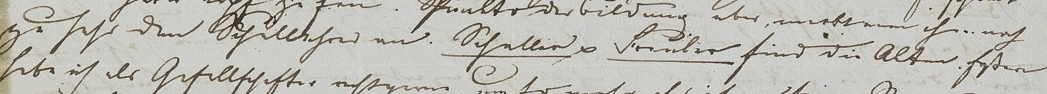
zu sehr den Schullehrer an. Schaller & Freuler sind die Alten. Erstern
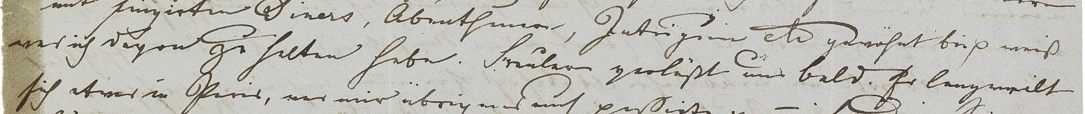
was ich davon zu halten habe. Freuler verläßt uns bald. Er langweilt
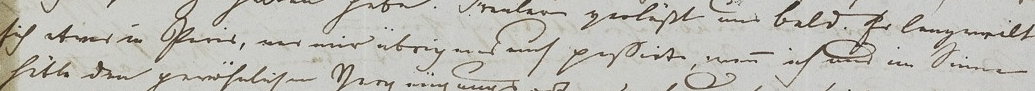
sich etwas in Paris, was mir übrigens auch passirte, wenn ich nur im Sinne
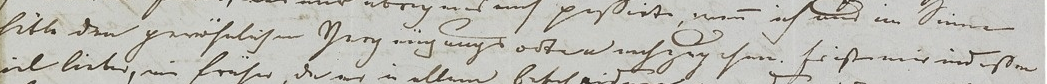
hätte den gewöhnlichen Vergnügungsorten nachzugehen. Er ist mir indessen
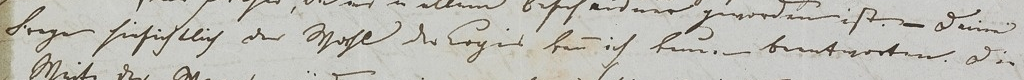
Frage hinsichtlich der Wahl des Logis kann ich kaum beantworten. Die
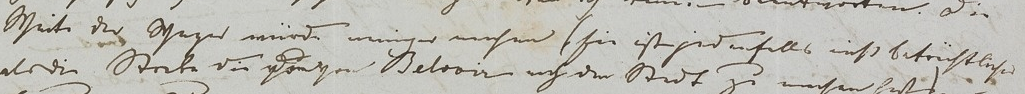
Weite des Weges würde weniger machen (sie ist jedenfalls nicht beträchtlicher
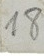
groß
